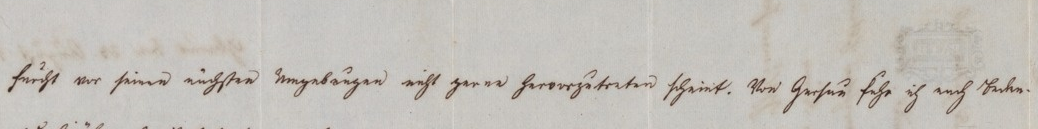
Furcht vor seinen nächsten Umgebungen nicht gerne hervorzutreten scheint. Von Gersau fuhr ich nach Becken-
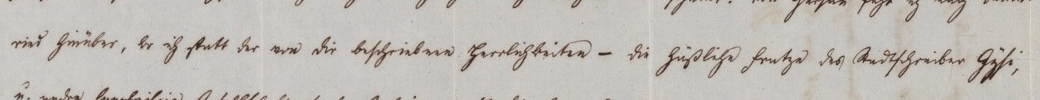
ried hinüber, wo ich statt der dir beschriebnen Herrlichkeiten – die häßliche Fratze des Stadtschreiber Gysi,
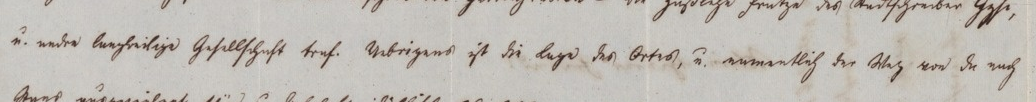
u. andre langweilige Gesellschaft traf. Uebrigens ist die Lage des Ortes, u. namentlich der Weg von da nach
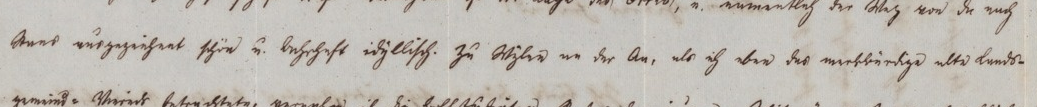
Stans ausgezeichnet schön u. wahrhaft idyllisch. Zu Wylen an der Aa, als ich eben das merkwürdige alte Lands-
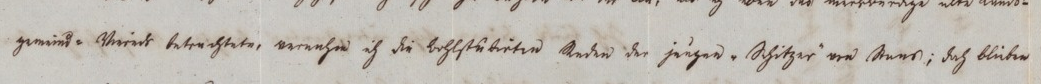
gemeind-Viereck betrachtete, vernahm ich die wohlstudirten Reden der jungen «Schitzer» von Stans; doch blieben
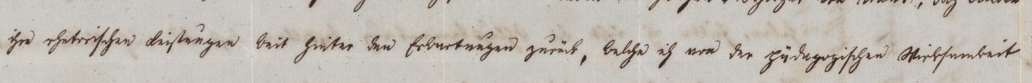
ihre rhetorischen Leistungen weit hinter den Erwartungen zurück, welche ich von der pädagogischen Wirksamkeit
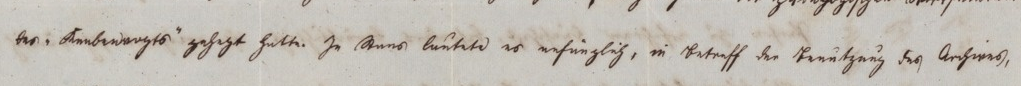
des «Knabenvogts» gehegt hatte. In Stans lautete es anfänglich, in Betreff der Benutzung des Archives,
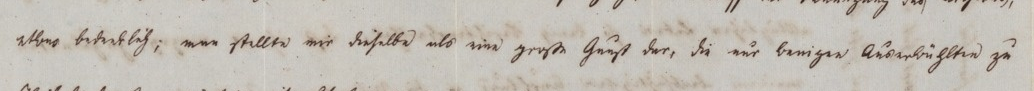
etwas bedenklich; man stellte mir dieselbe als eine große Gunst dar, die nur wenigen Auserwählten zu
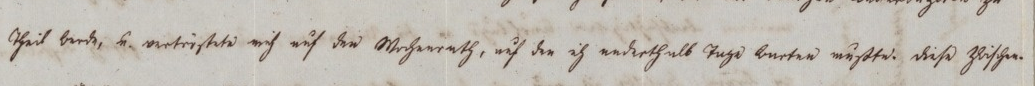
Theil werde, u. vertröstete mich auf den Wochenrath, auf den ich anderthalb Tage warten mußte. Diese Zwischen-
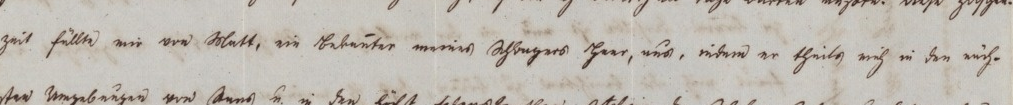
zeit füllte mir von Matt, ein bekannter meines Schwagers Heer, aus, indem er theils mich in den näch-
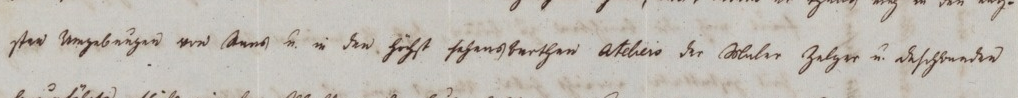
sten Umgebunge von Stans u. in den höchst sehenswerthen Ateliers der Maler Zelger u. Deschwanden
